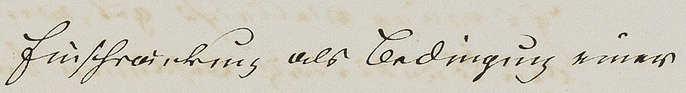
Einschränkung als Bedingung einer
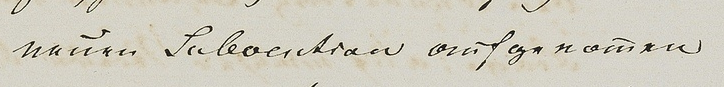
neuen Subvention aufgenommen
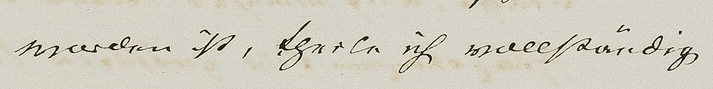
worden ist, theile ich vollständig
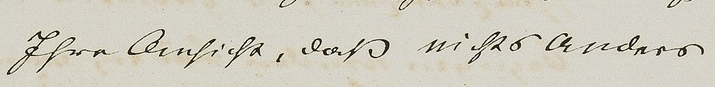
Ihre Ansicht, daß nichts Anders
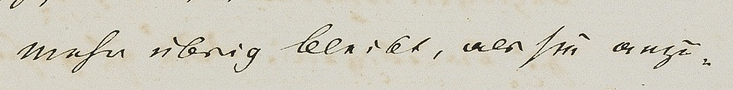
mehr übrig bleibt, als sie anzu-
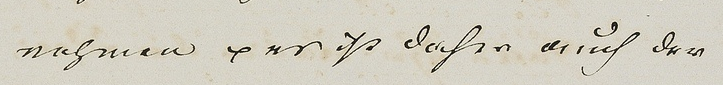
nehmen & es ist daher auch der
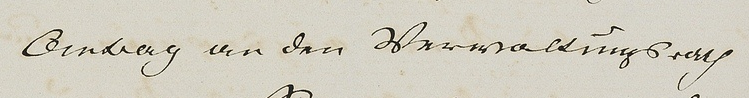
Antrag an den Verwaltungsrath
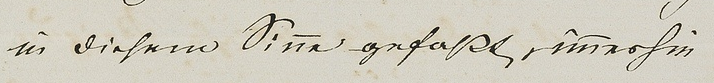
in diesem Sinne gefaßt, immerhin
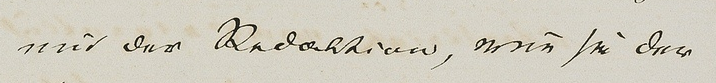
mit der Redaktion, wenn sie der
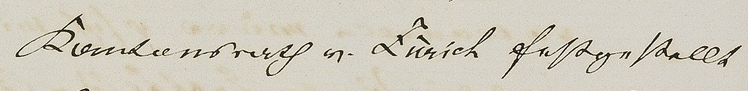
Kantonsrath v. Zürich festgestellt
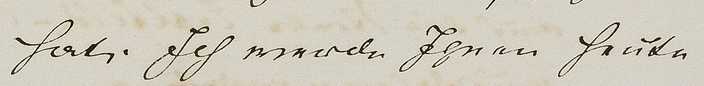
hat. Ich werde Ihnen heute
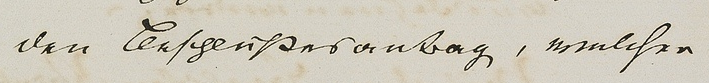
den Beschlußesantrag, welcher
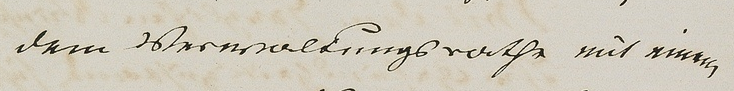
dem Verwaltungsrathe mit einem
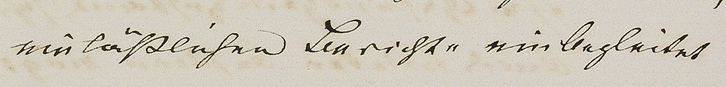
einläßlichen Berichte einbegleitet
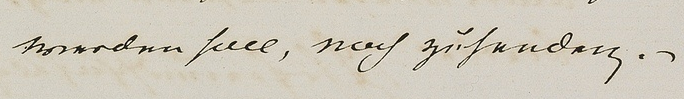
werden soll, noch zusenden. –
